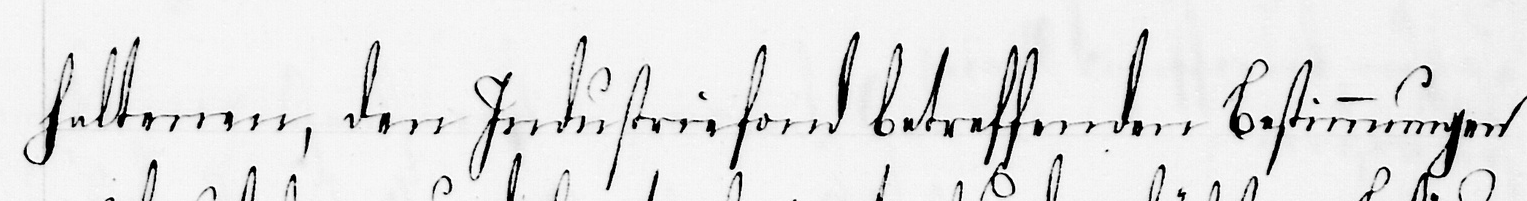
haltenen, den Industriefond betreffenden Bestimmungen
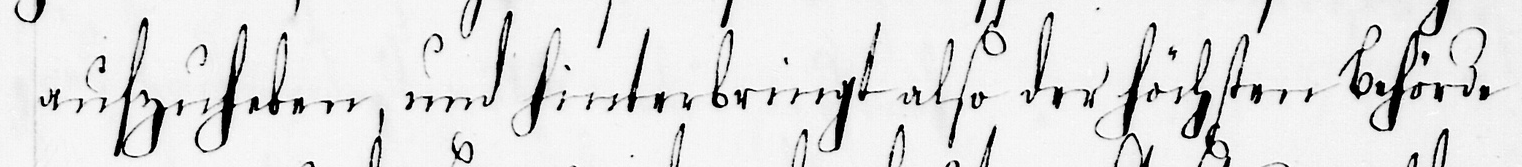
aufzuheben, und hinterbringt also der höchsten Behörde
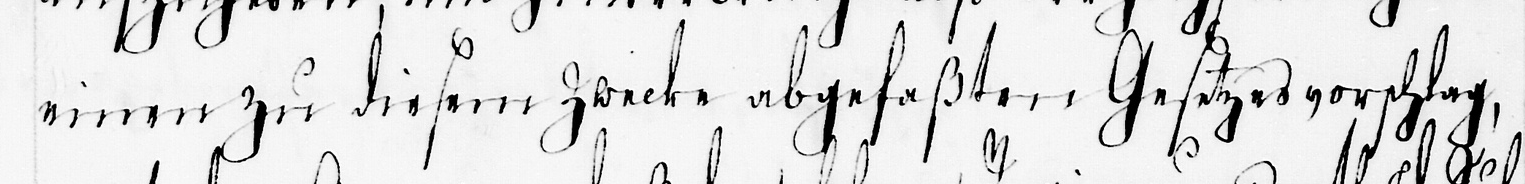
einen zu diesem Zwecke abgefaßten Gesetzesvorschlag,
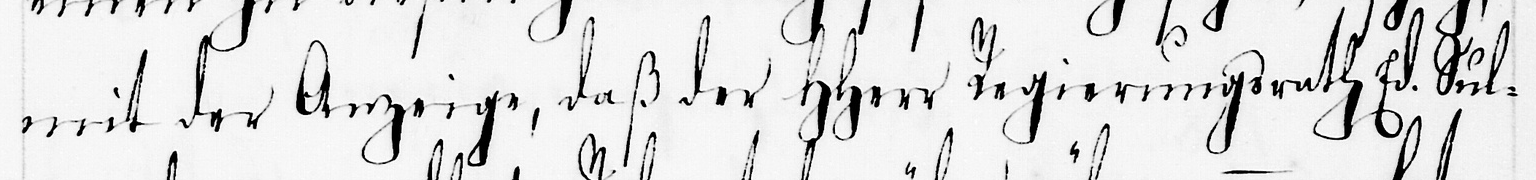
mit der Anzeige, daß der HHerr Regierungsrath Ed. Sul¬
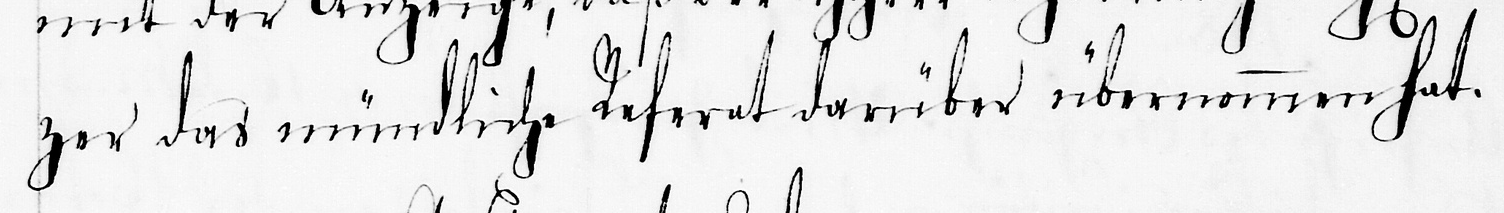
zer das mündliche Referat darüber übernommen hat.
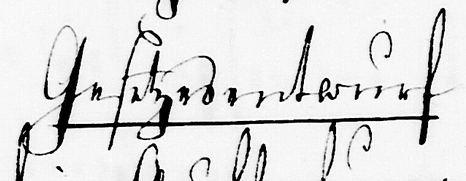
Gesetzesentwurf
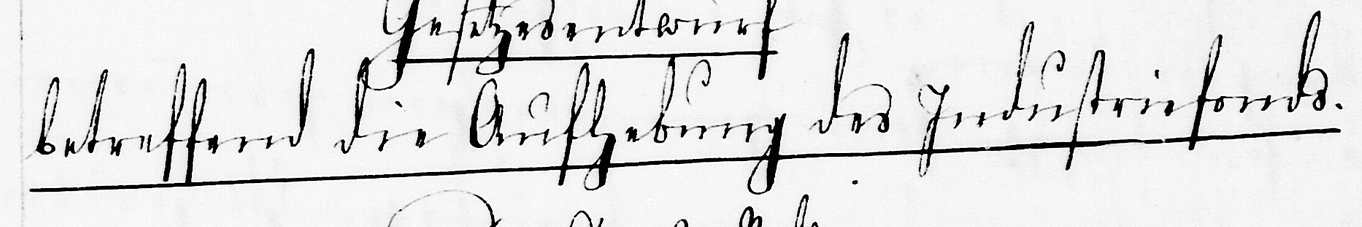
betreffend die Aufhebung des Industriefonds.
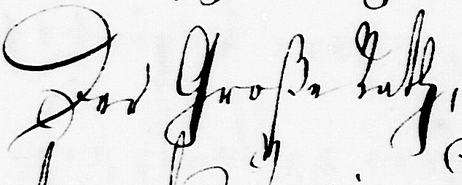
Der Große Rath,
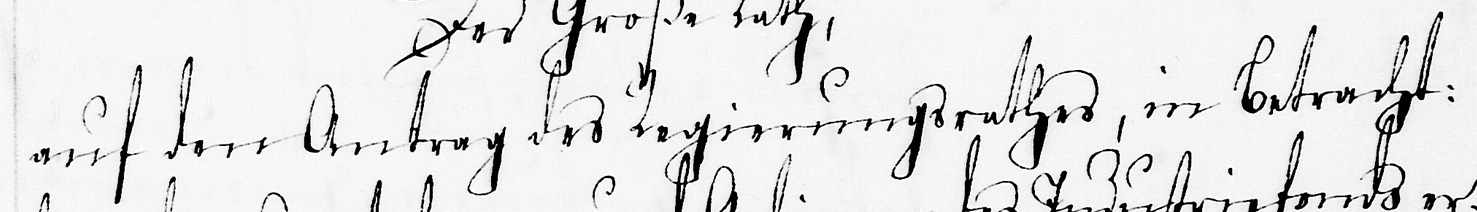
auf den Antrag des Regierungsrathes, in Betracht:
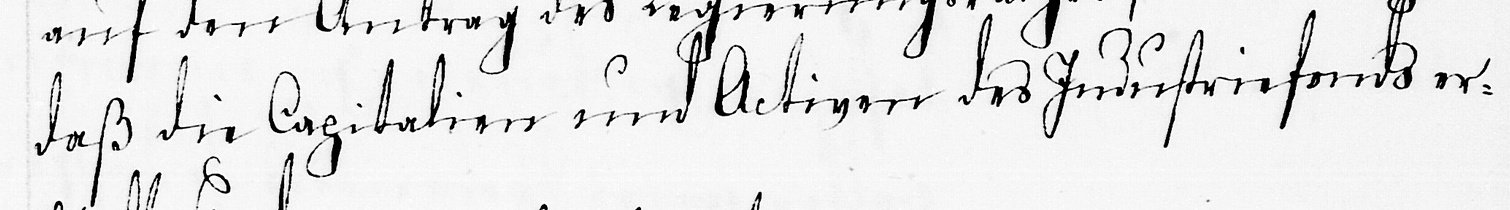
daß die Capitalien und Activen des Industriefonds er¬
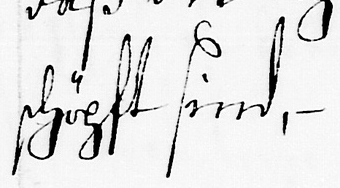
öpft sind,
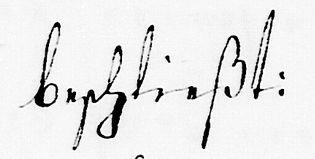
beschließt:
